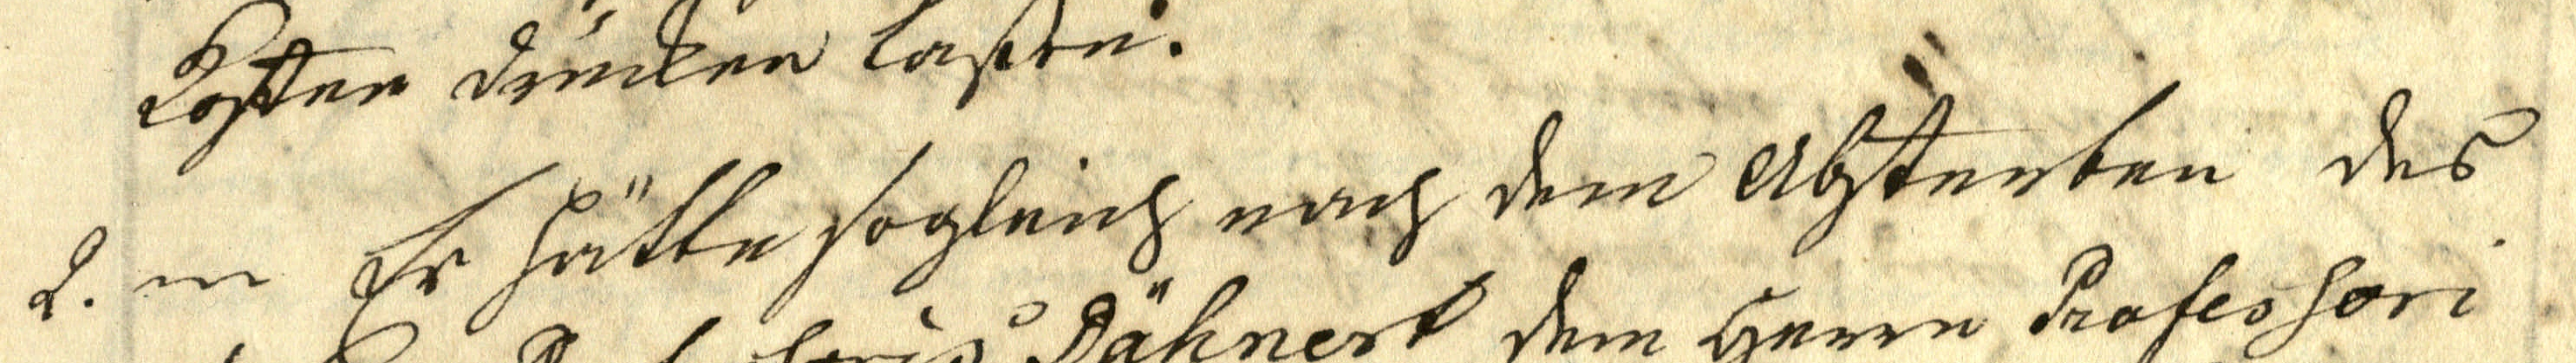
2.Er hätte sogleich nach dem Absterben des
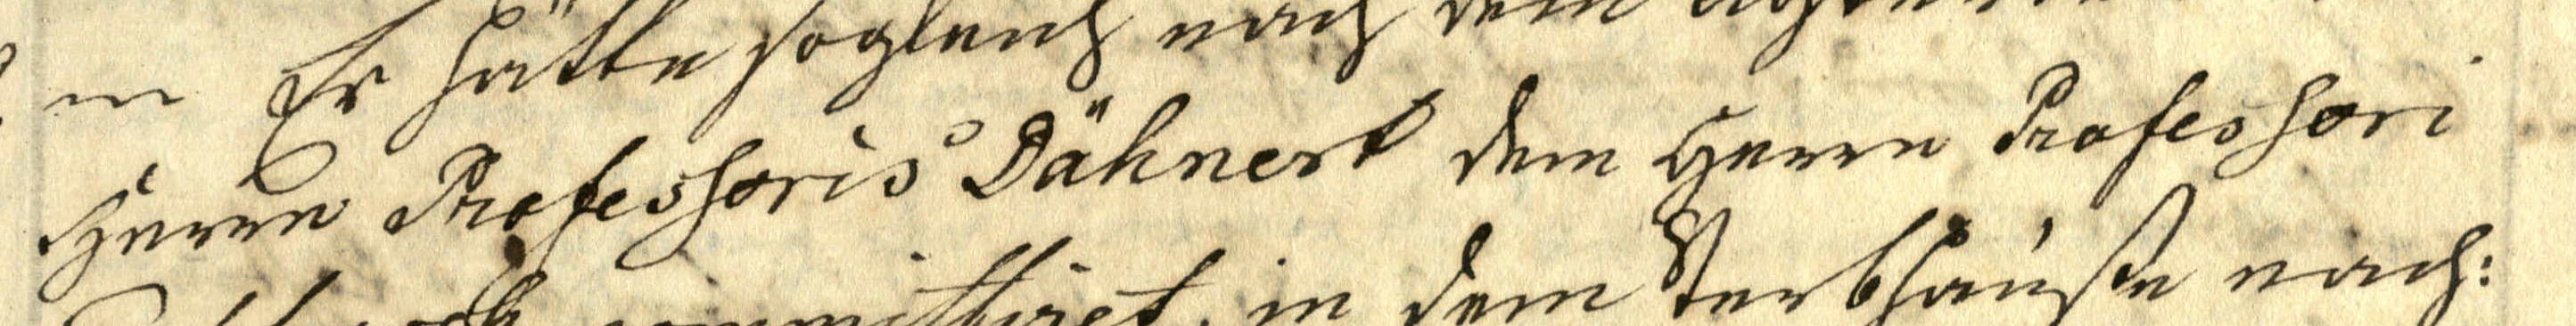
Herrn Professoris Dähnert dem Herrn Professori
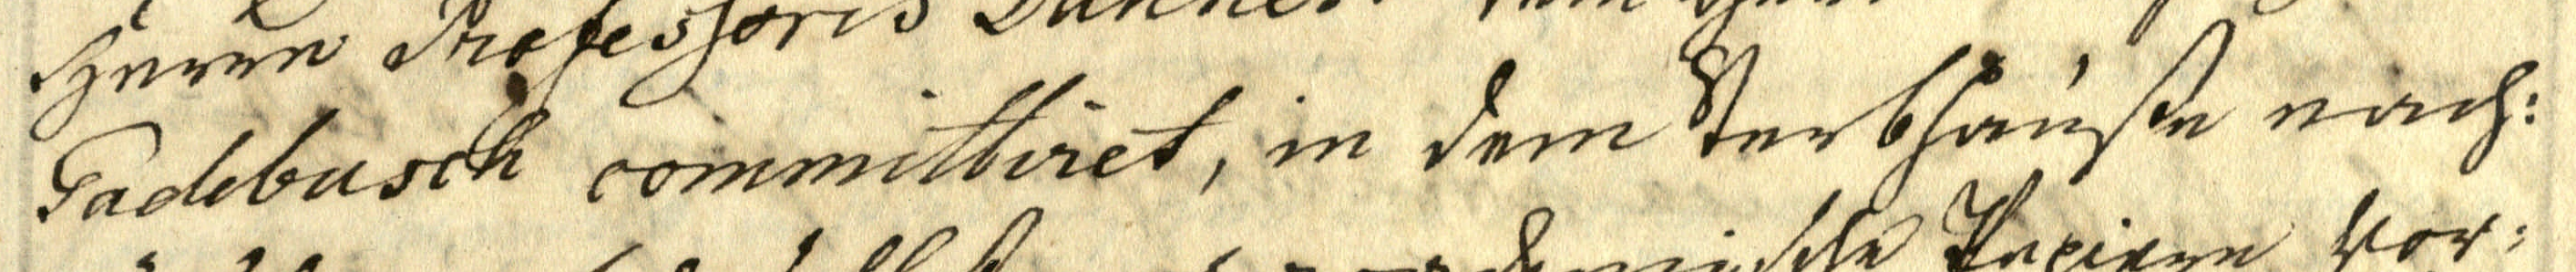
Gadebusch committiret, in dem Sterbhauße nach¬
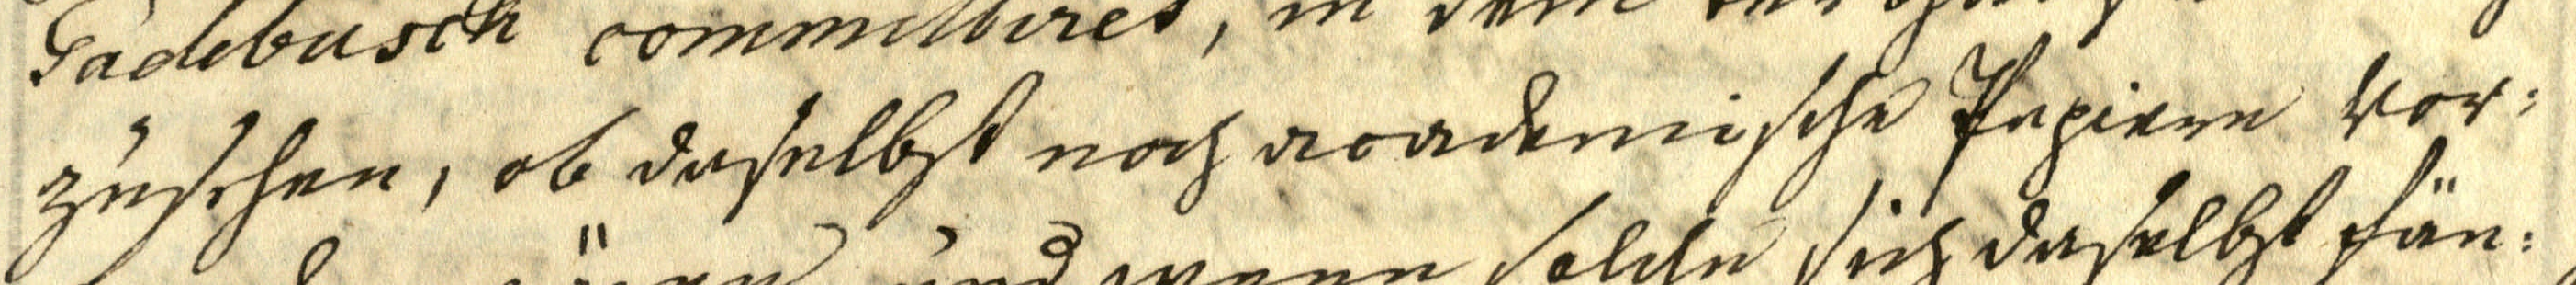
zusehen, ob daselbst noch academische Papiere vor¬
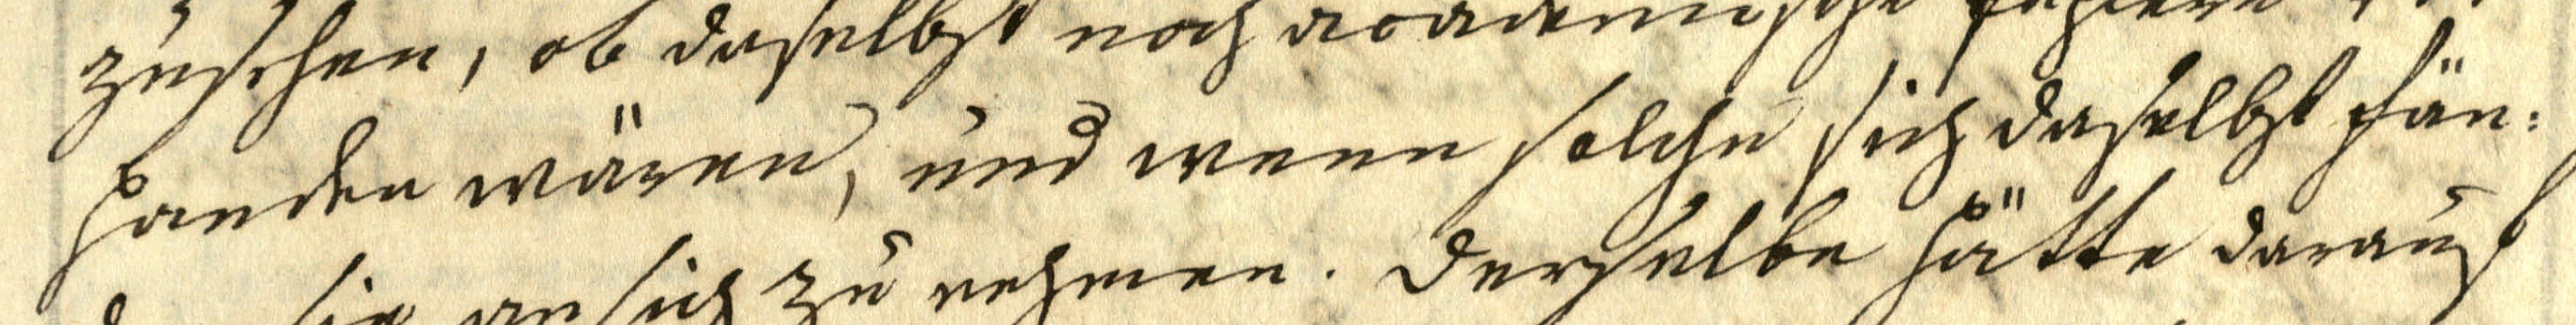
handen wären, und wenn solche sich daselbst fän¬
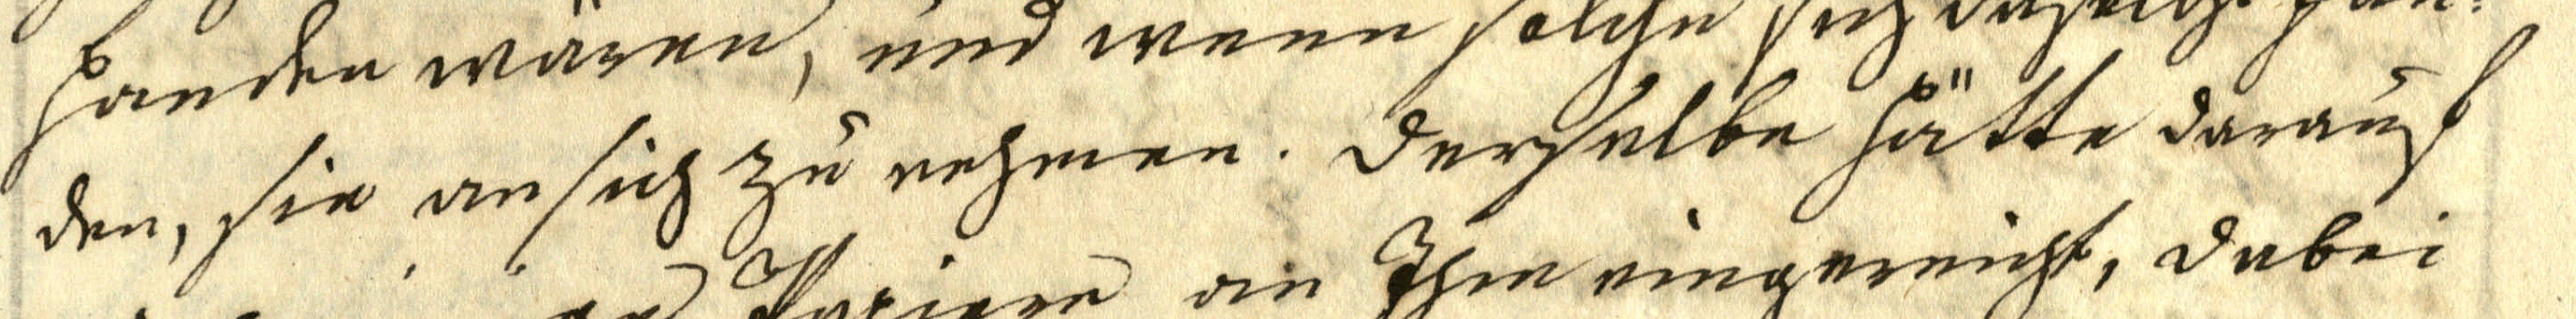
den, sie an sich zu nehmen. Derselbe hätte darauf
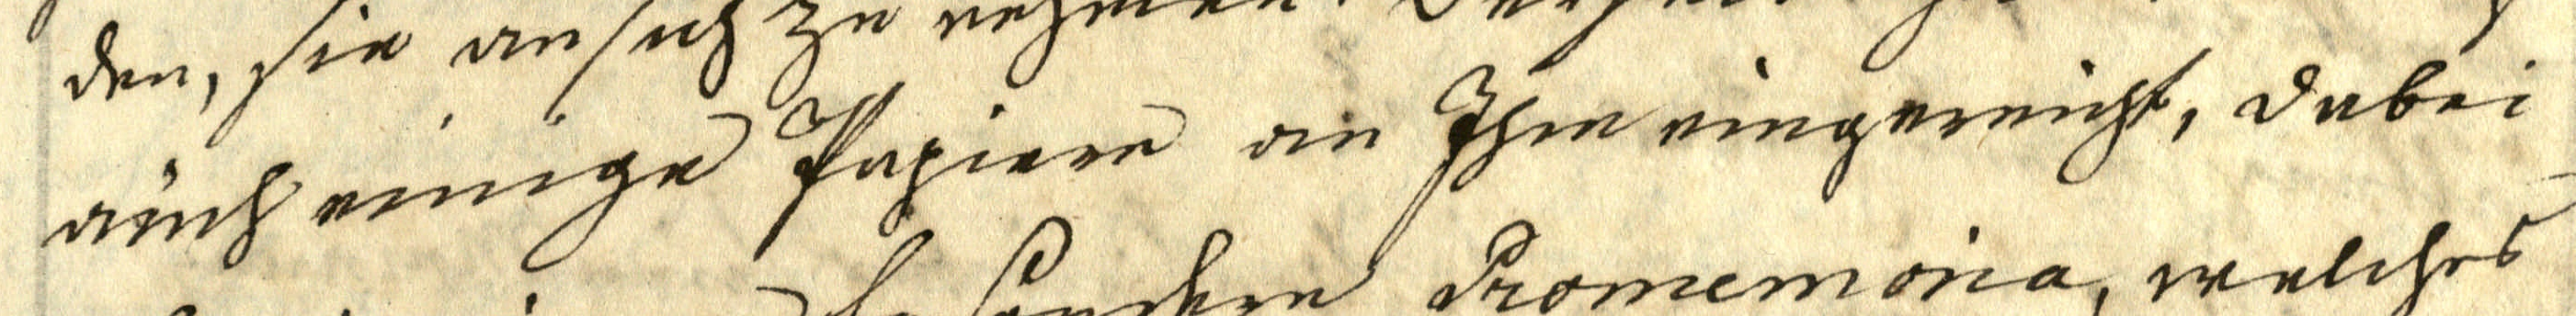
auch einige Papiere an Ihm eingereicht, dabei
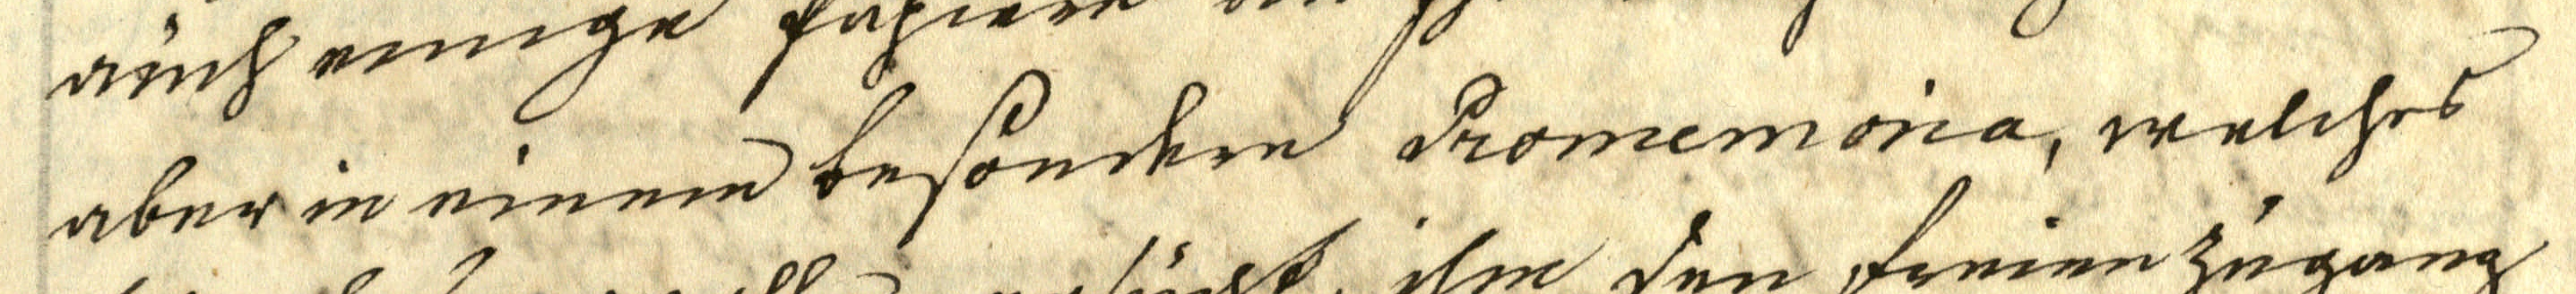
aber in einem besondern Promemoria, welches
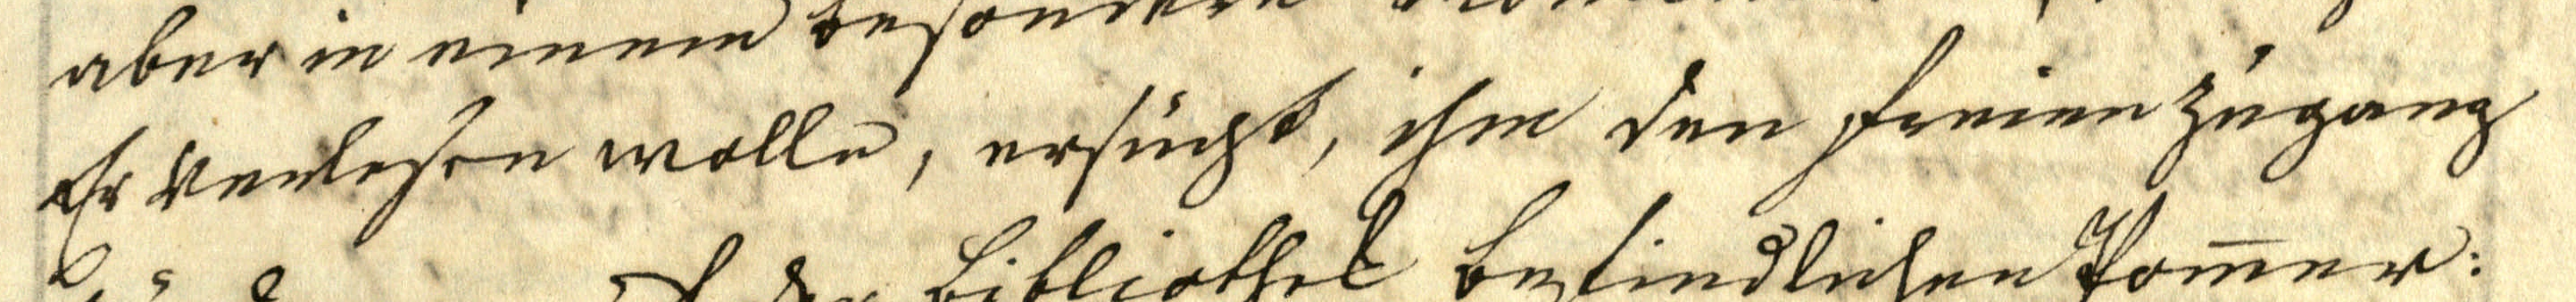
Er verlesen wolle, ersucht, ihm den freien Zugang
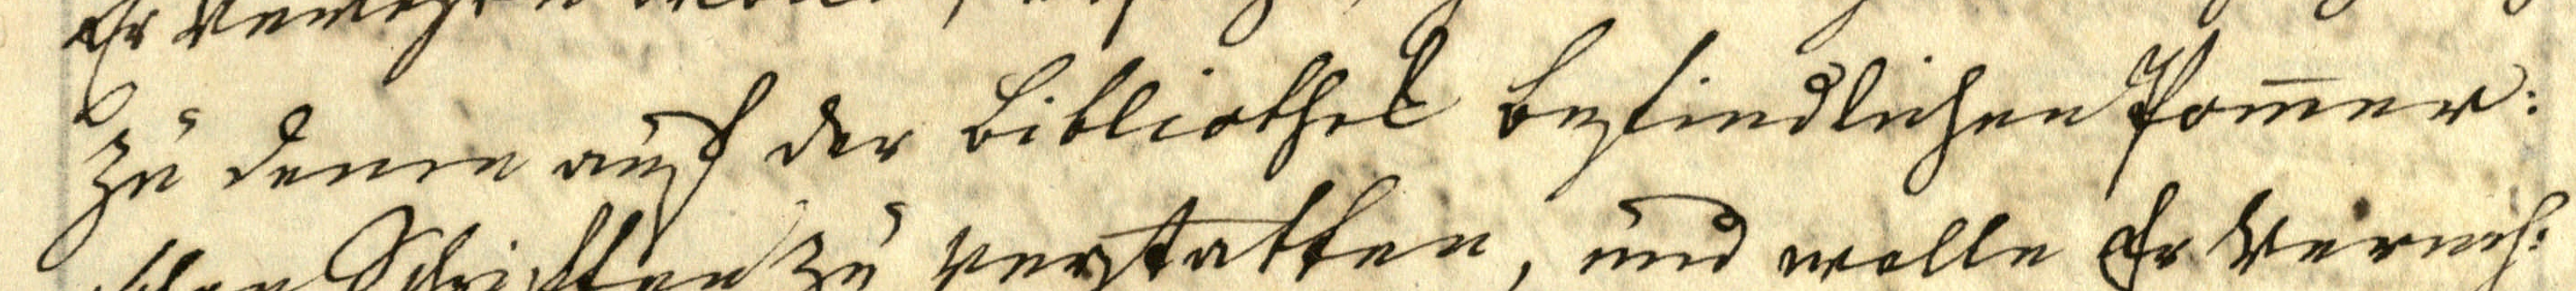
zu denen auf der Bibliothek befindlichen Pomer¬
